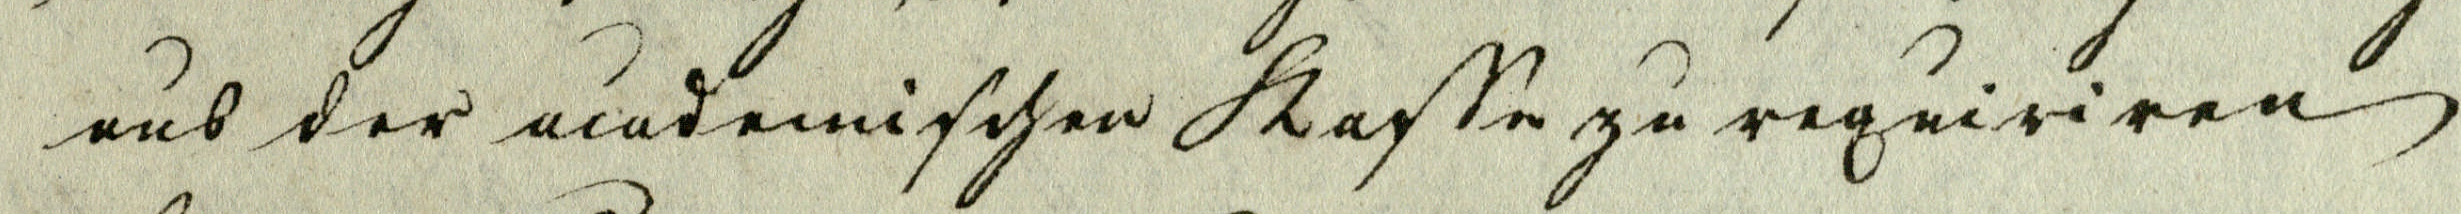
aus der academischen Kasse zu requiriren
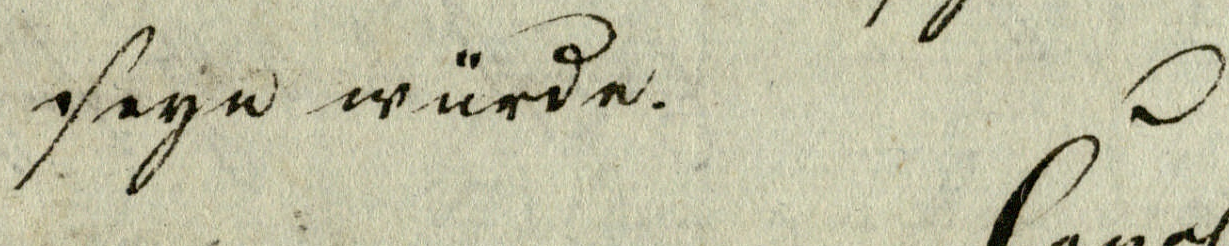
seyn würde.
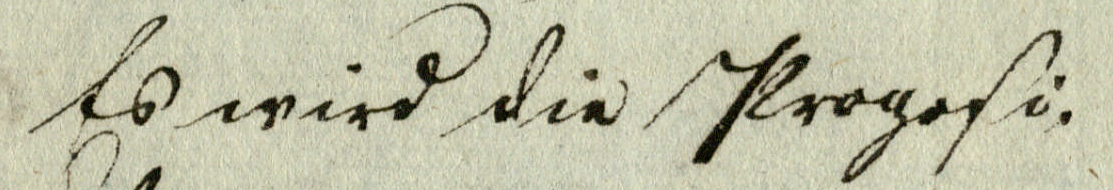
Es wird die Proposi¬
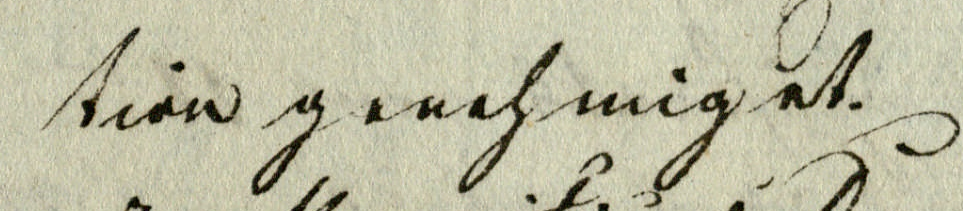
tion genehmiget.
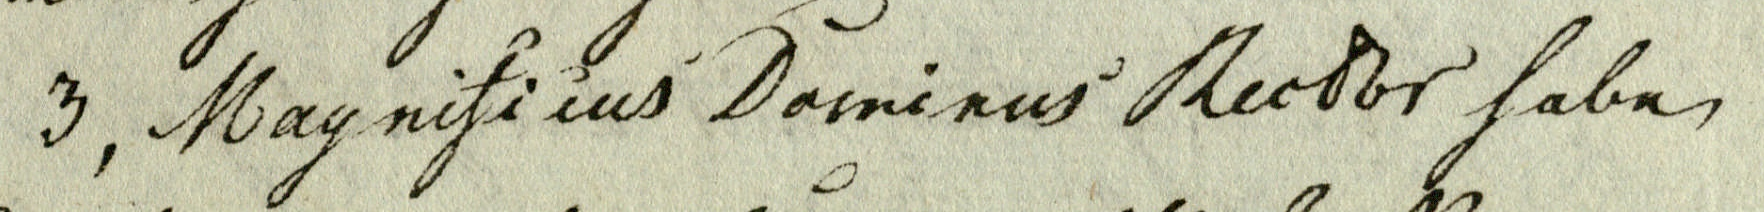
3, Magnificus Dominus Rector habe
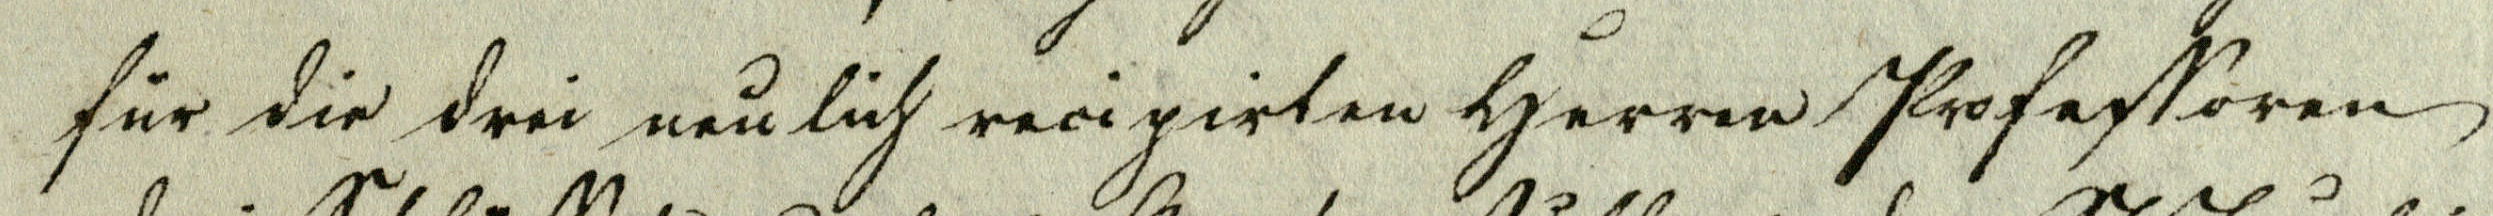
für die drei neulich recipirten Herren Professoren
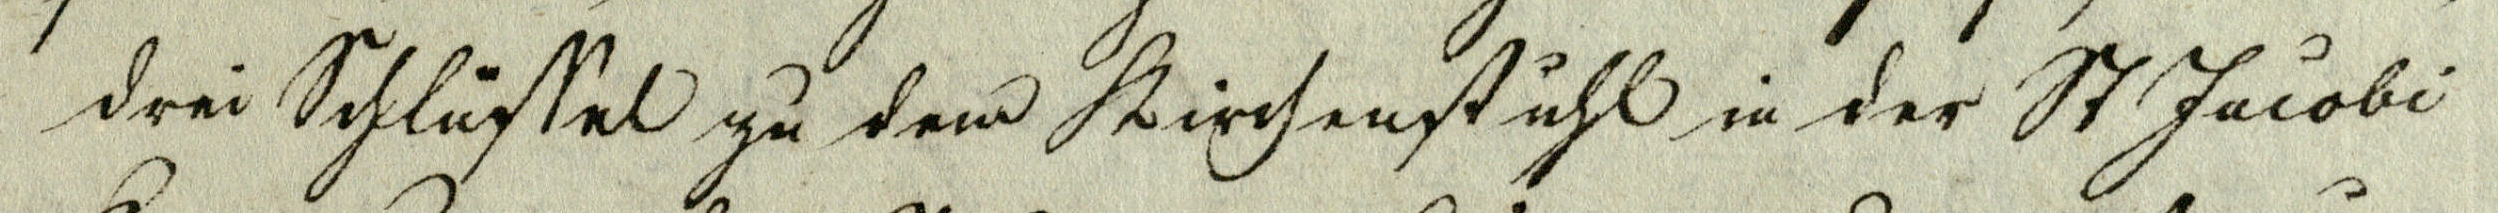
drei Schlüssel zu dem Kirchenstuhl in der St Jacobi
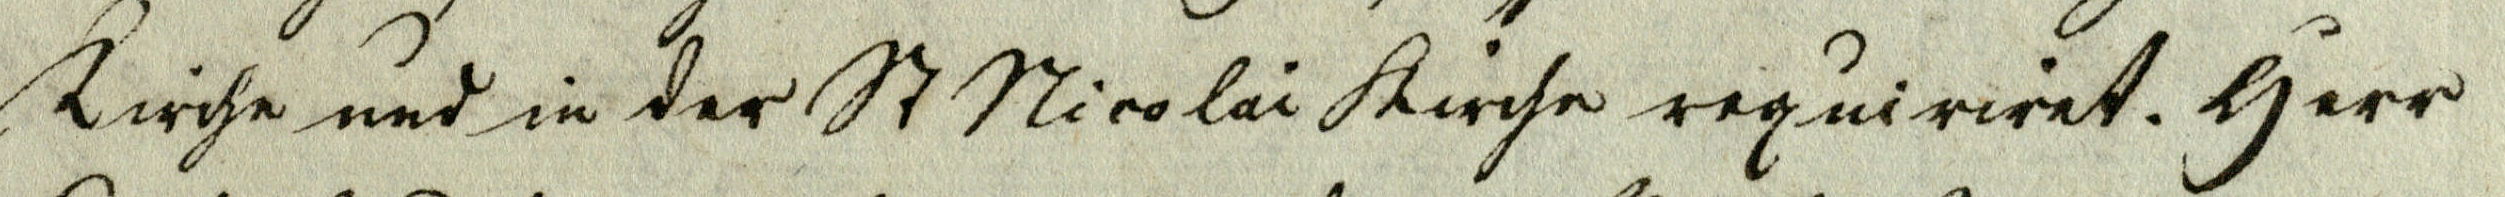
Kirche und in der St Nicolai Kirche requiriret. Herr
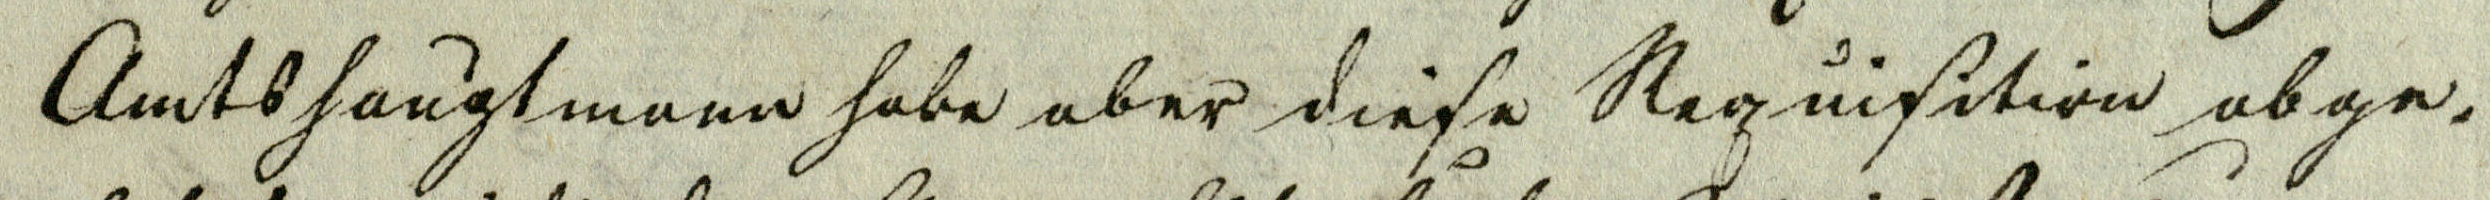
Amtshauptmann habe aber diese Requisition abge¬
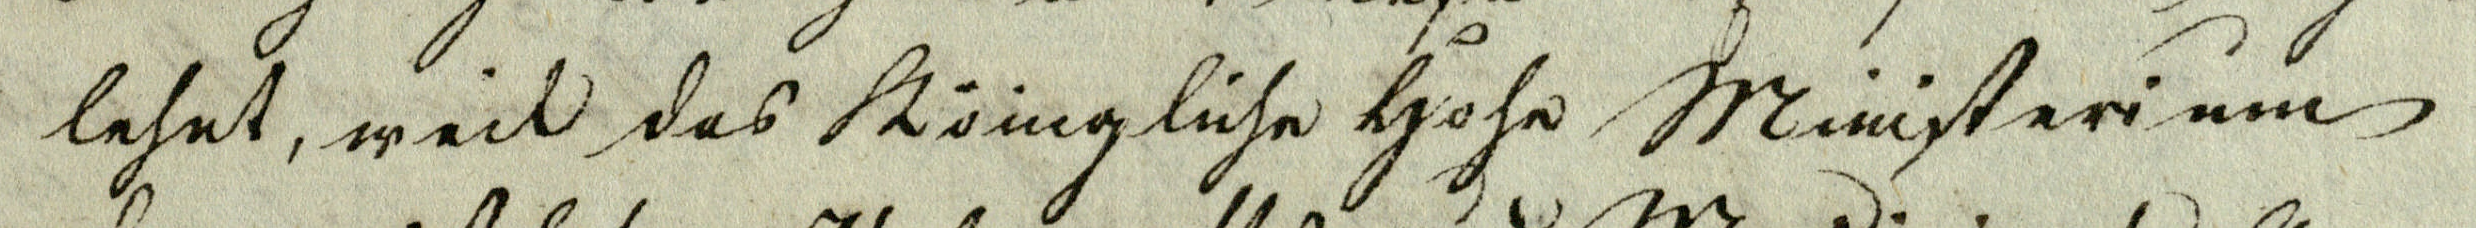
lehnt, weil das Königliche Hohe Ministerium
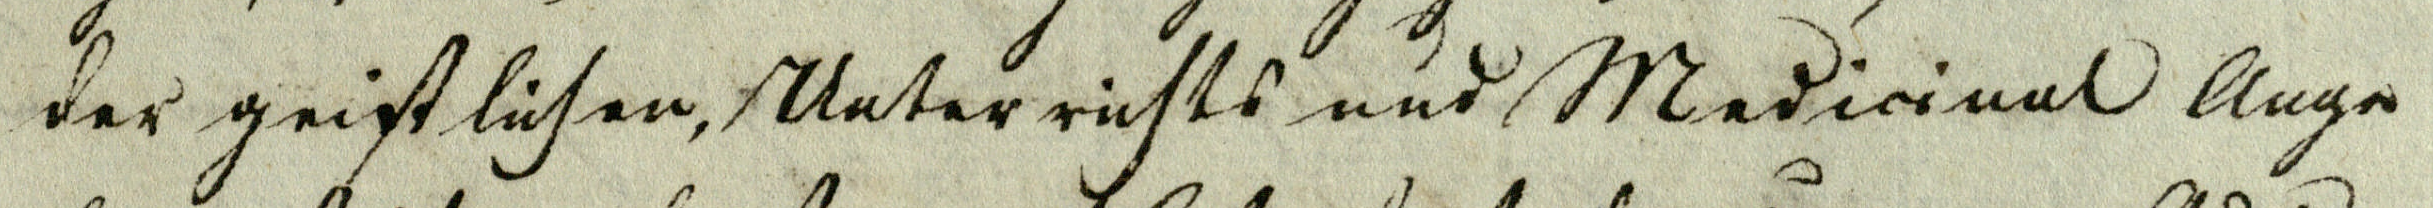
der geistlichen, Unterrrichts und Medicinal Ange¬
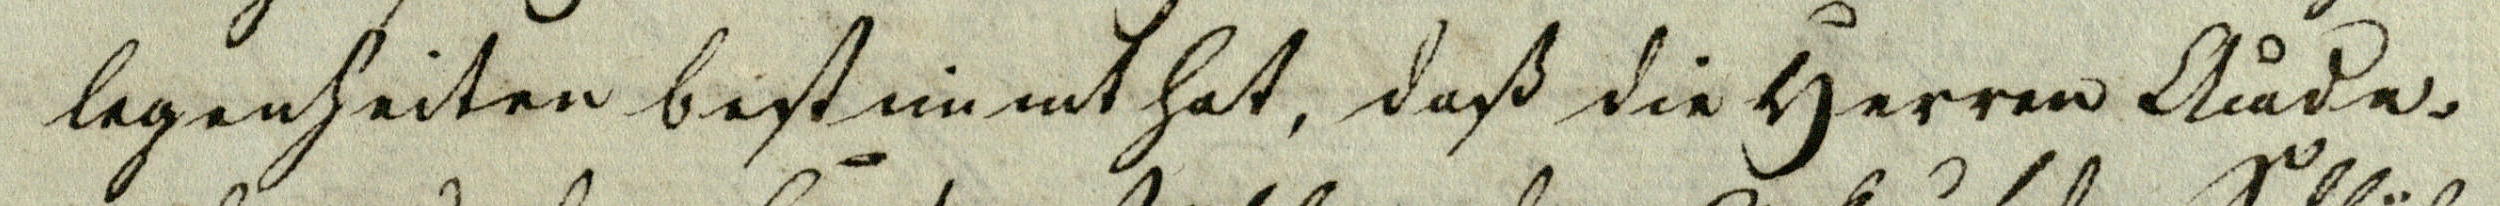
legenheiten bestimmt hat, daß die Herrn Acade¬
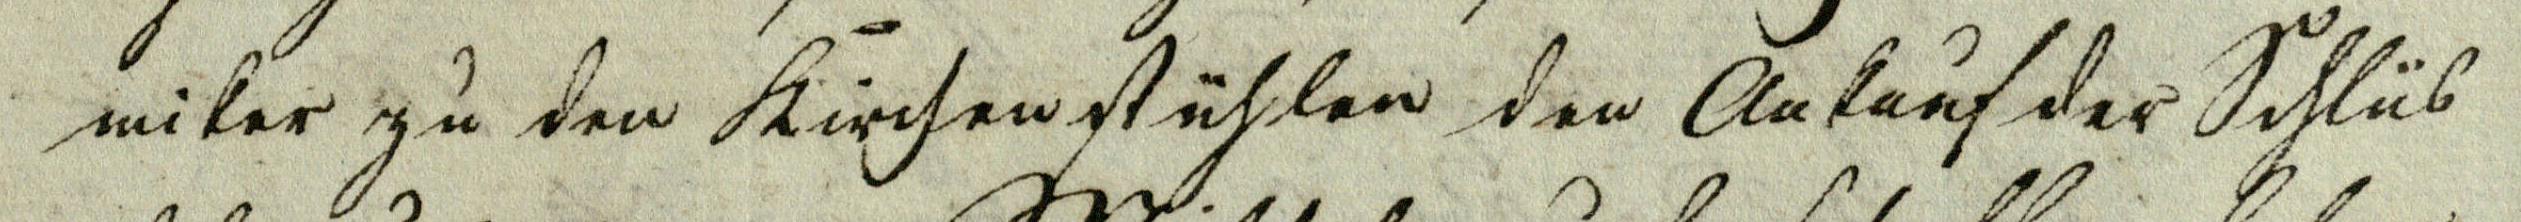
miker zu den Kirchenstühlen den Ankauf der Schlüs¬
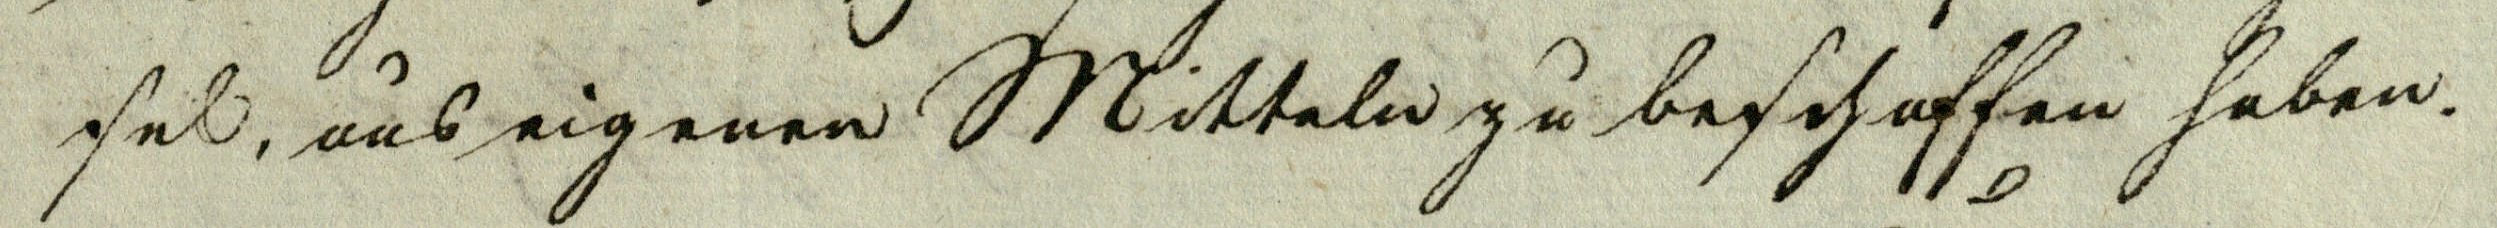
sel, aus eigenen Mitteln zu beschaffen haben.
